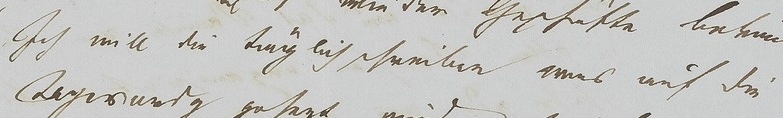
Ich will dir täglich schreiben was auf die
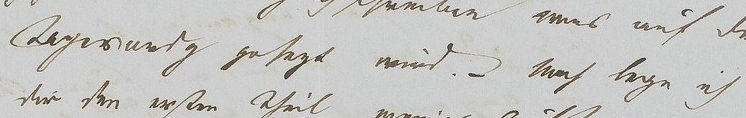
Tagesordnung gesezt wird. – Noch lege ich
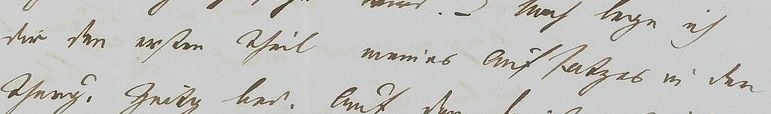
dir den ersten Theil meines Aufsatzes in der
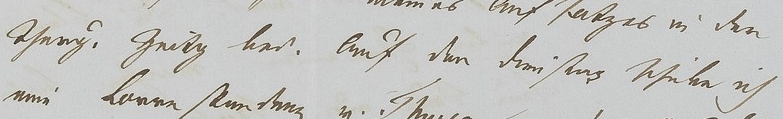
Thurg. Zeitung bei. Auf den Dienstag schicke ich
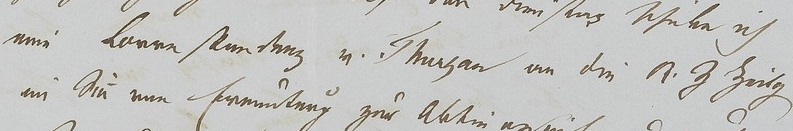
eine Correspondenz v. Thurgau an die N. ZZeitung
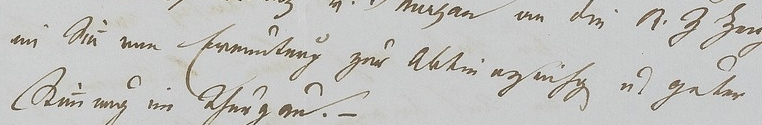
im Sinn von Ermunterung zur Aktienzeichnung u. guter
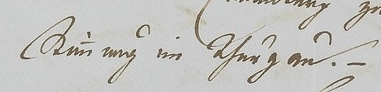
Stimmung im Thurgau. –
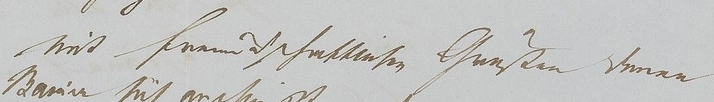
Mit freundschaftlichen Grüßen denen
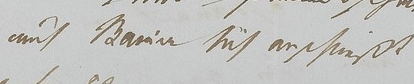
auch Bavier sich anschließt
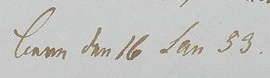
Bern den 16 Jan 53.
